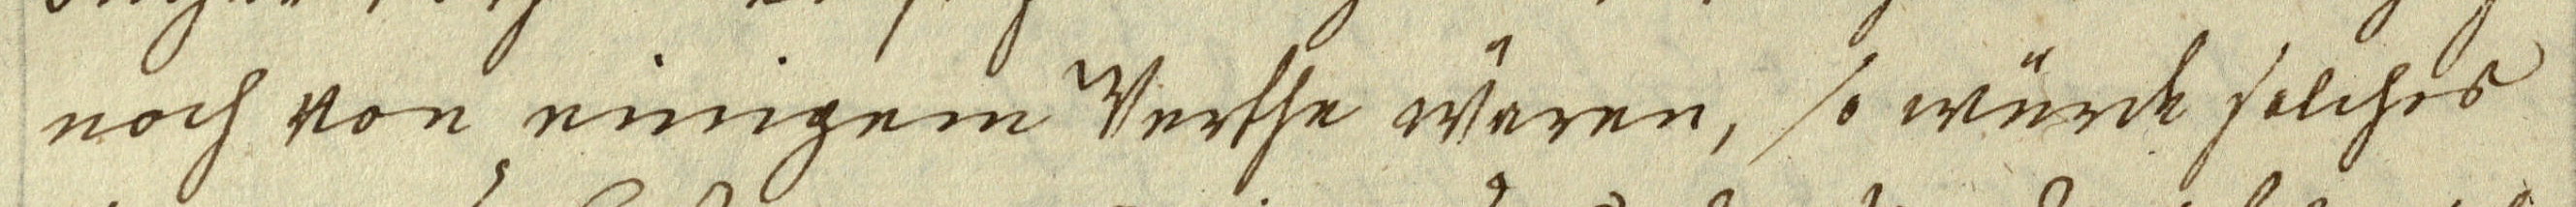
noch von einigem Werthe wären, so würde solches
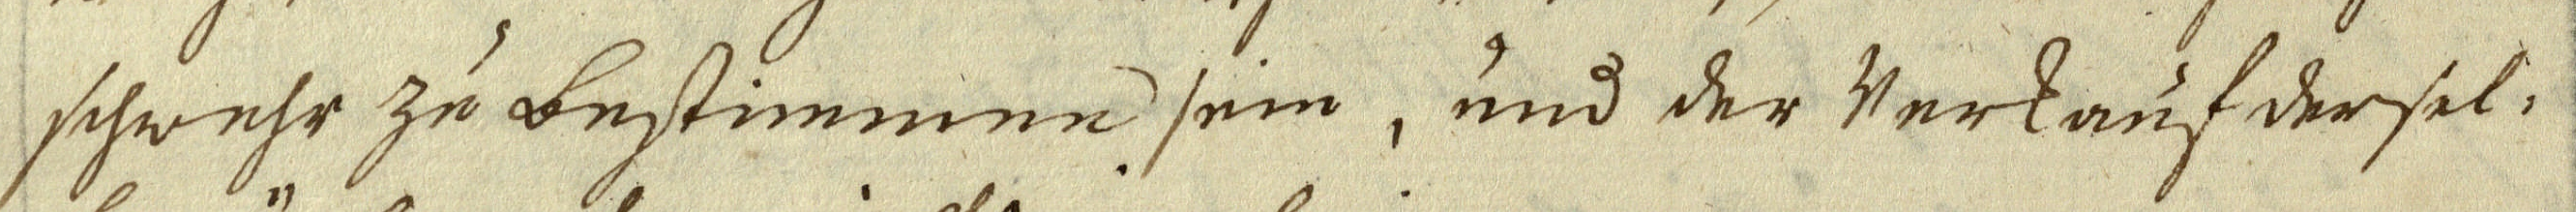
schwehr zu bestimmen sein, und der Verkauf dersel¬
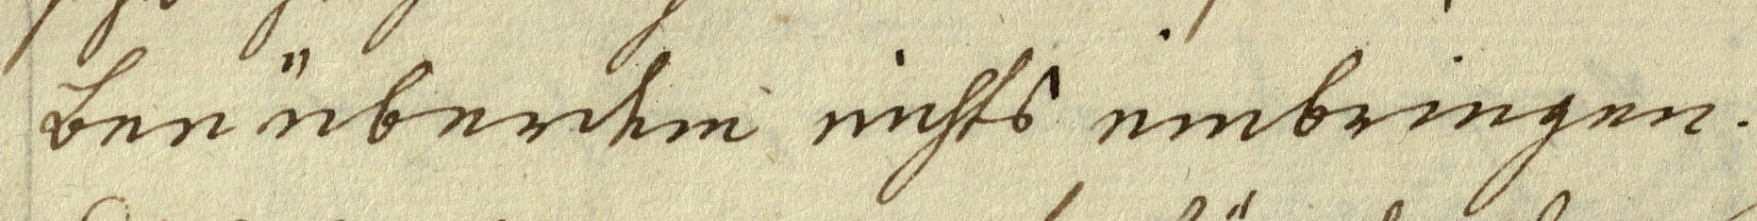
ben überdem nichts einbringen.
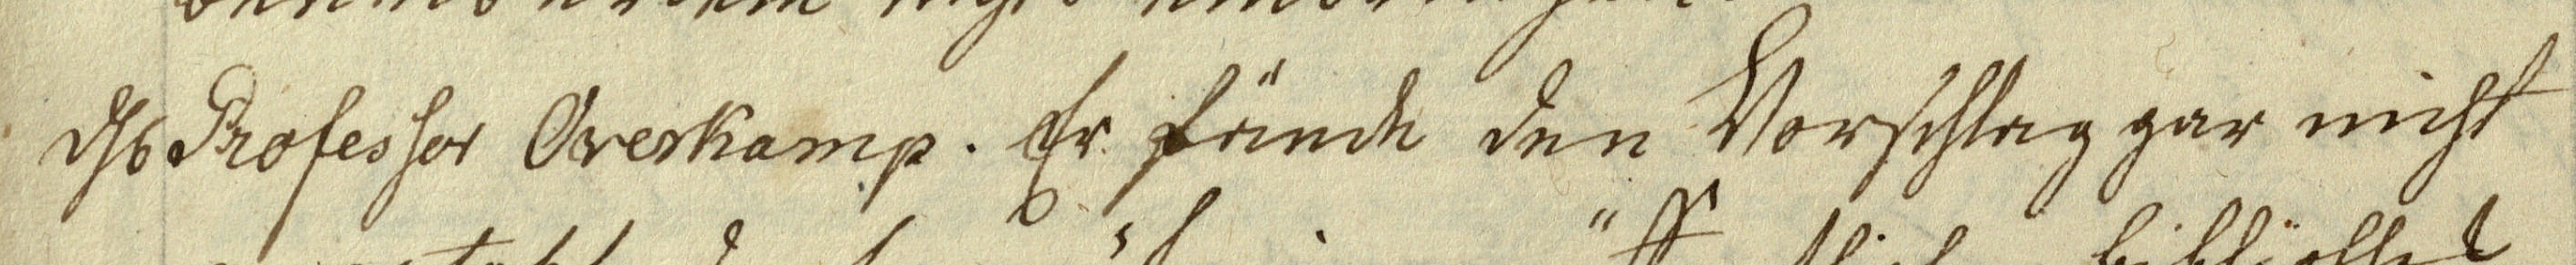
dh Professor Overkamp. Er fände den Vorschlag gar nicht
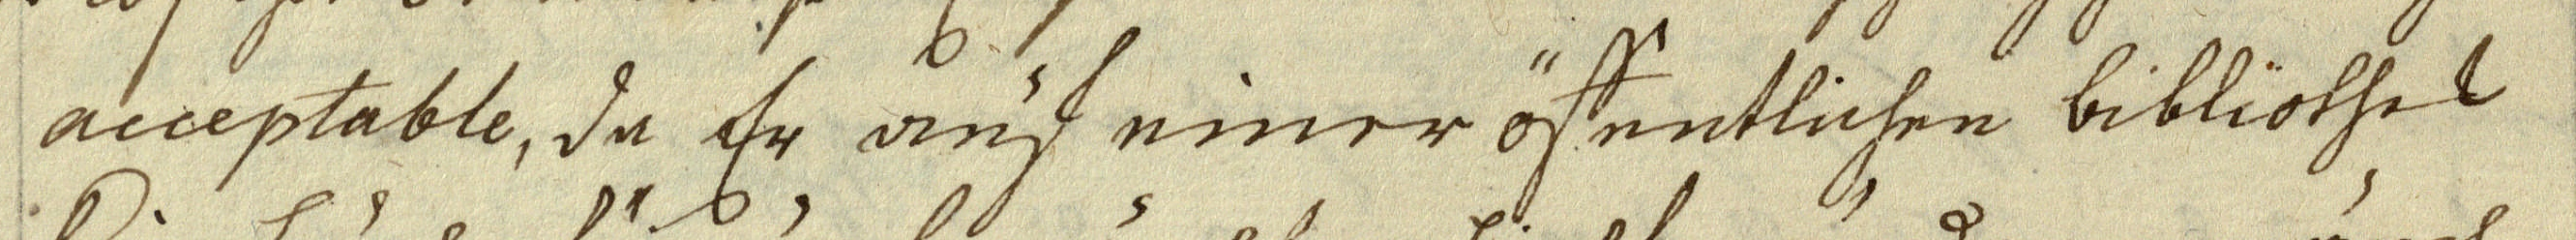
acceptable, da Er auf einer öfentlichen Bibliothek
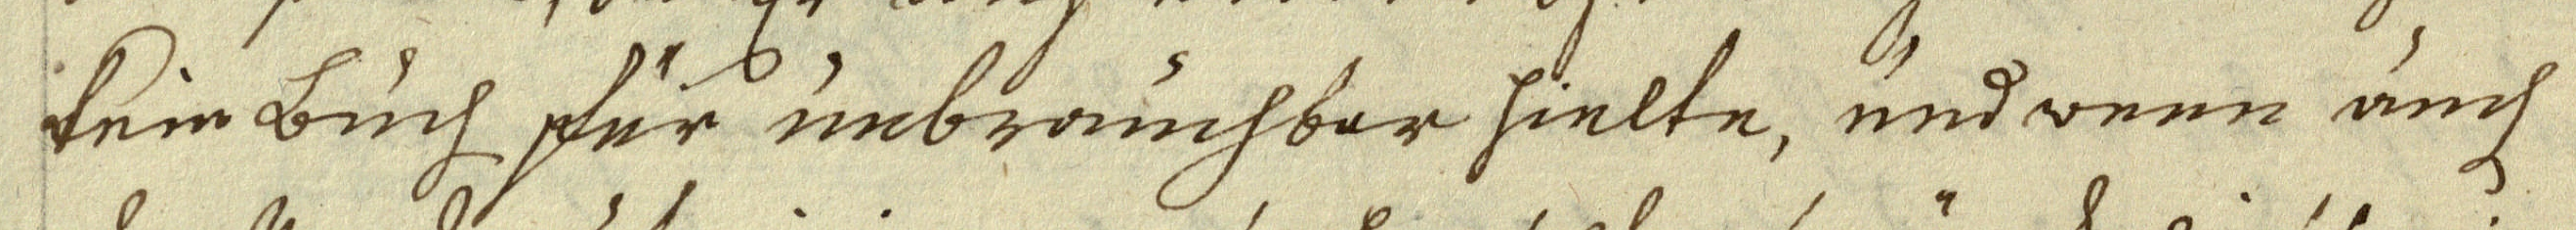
kein Buch für unbrauchbar hielte, und wenn auch
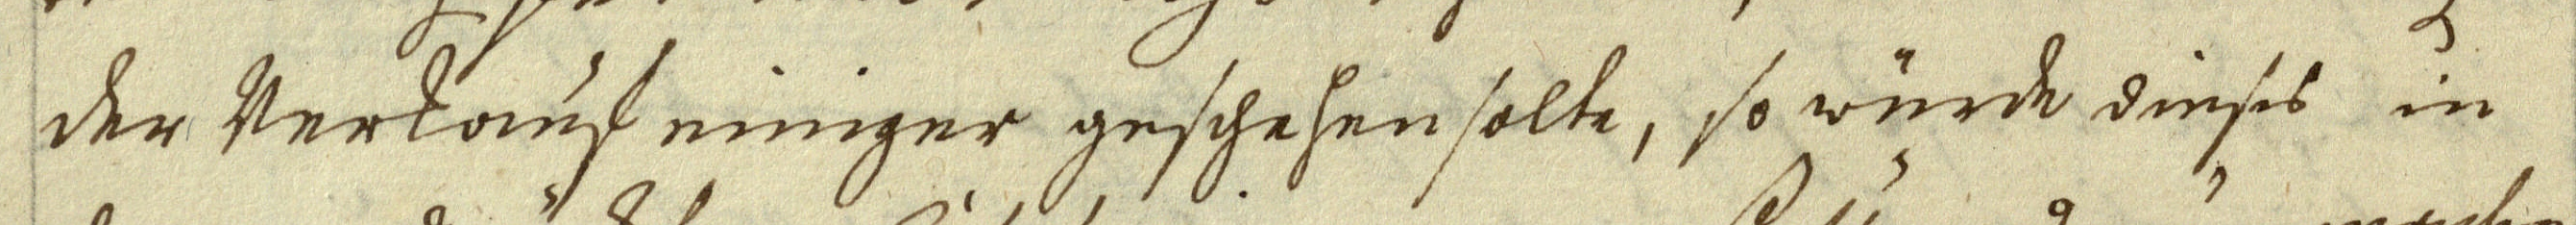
der Verkauf einiger geschehen solte, so würde dieses in
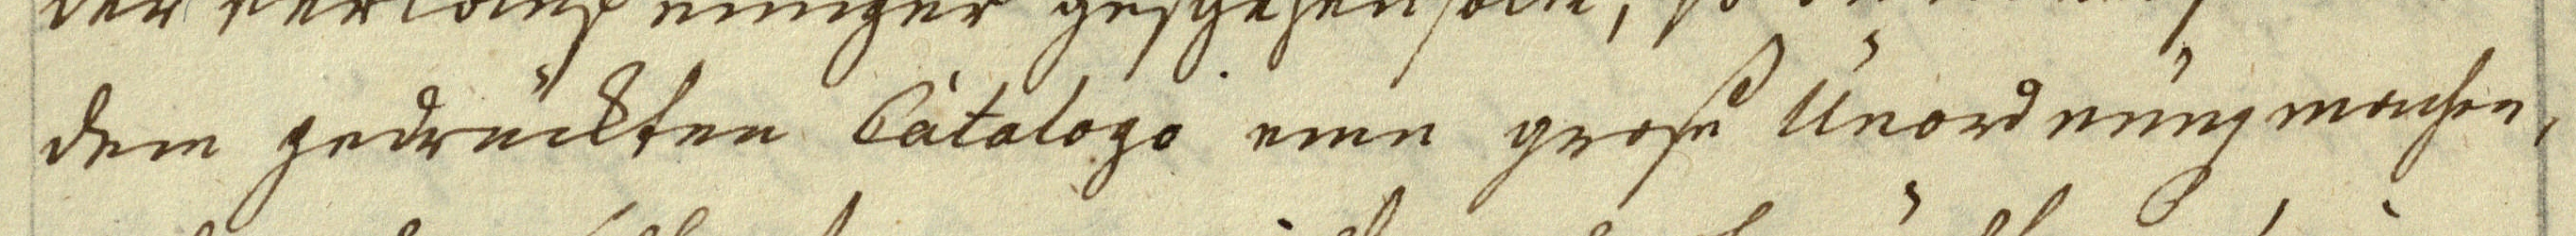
dem gedruckten Catalogo eine große Unordnung machen,
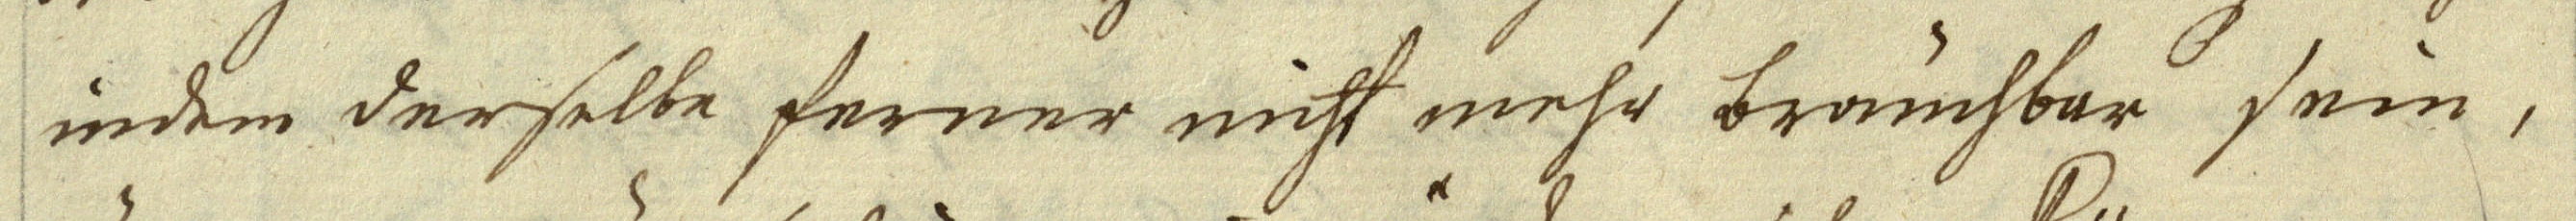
indem derselbe ferner nicht mehr brauchbar sein,
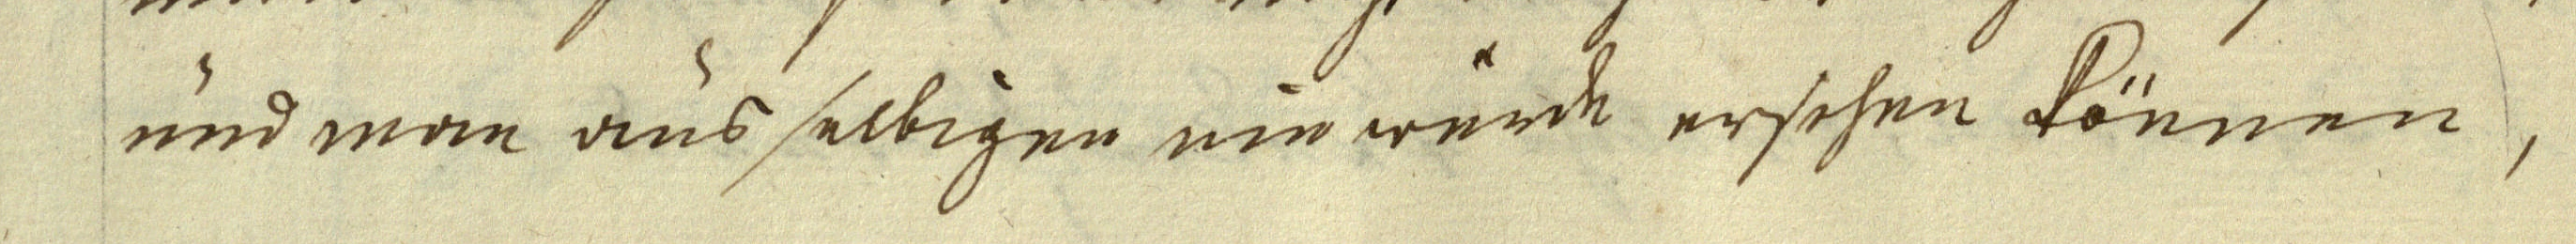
und man aus selbigen nie würde ersehen können,
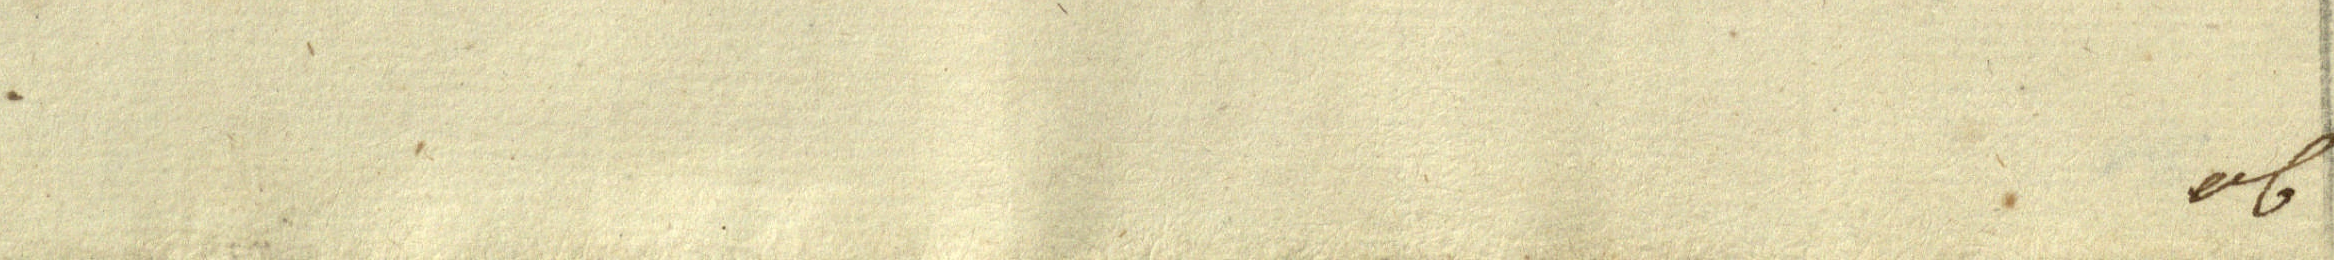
ob
